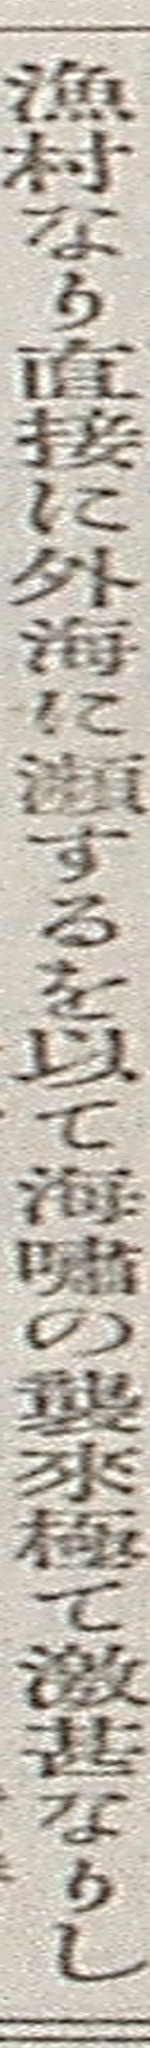漁村なり直接に外海に瀕するを以て海嘯の襲来極て激甚なりし
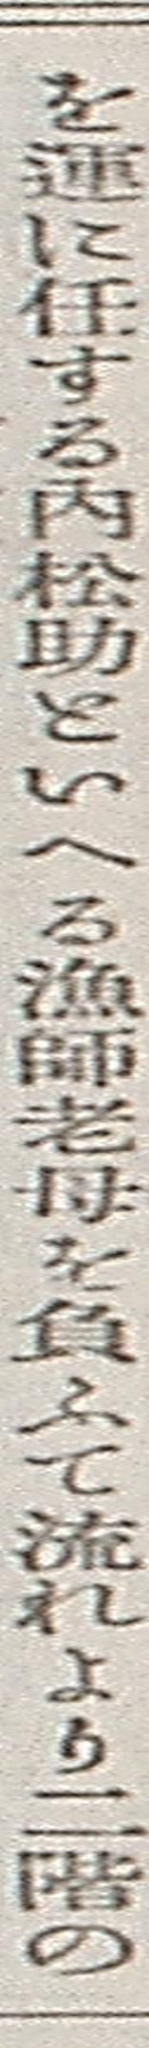を運に任する内松助といへる漁師老母を負ふて流れより二階の
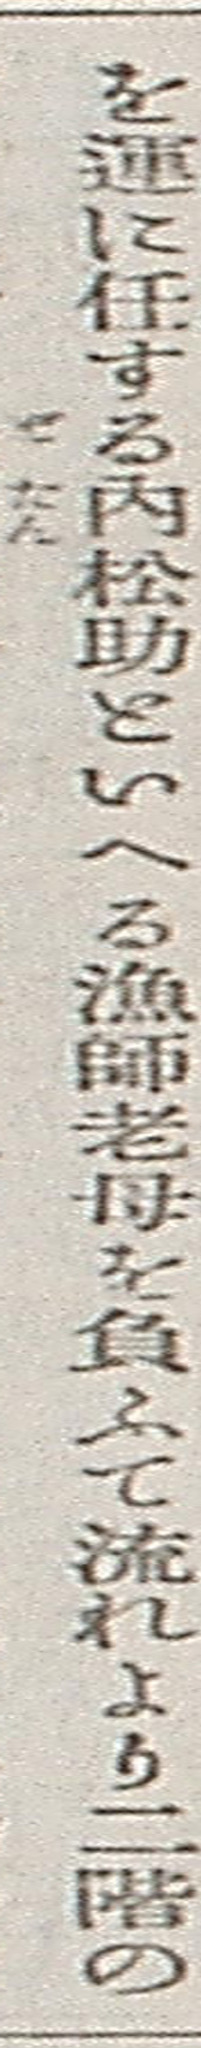を運に任する内松助といへる漁師老母を負ふて流れより二階の
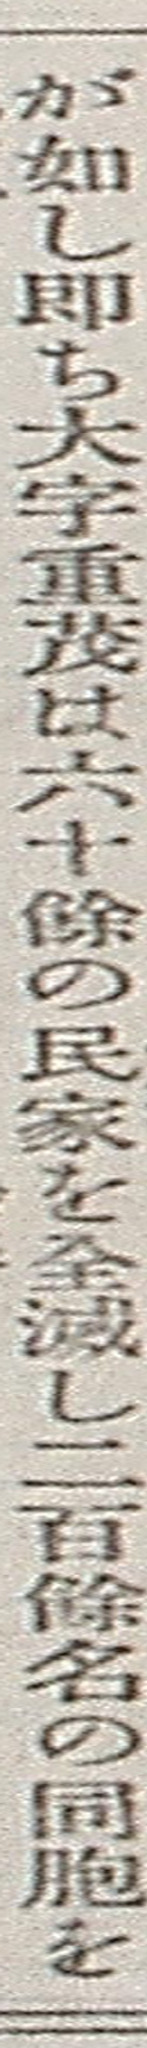が如し即ち大字重茂は六十余の民家を全滅しニ百余名の同胞を
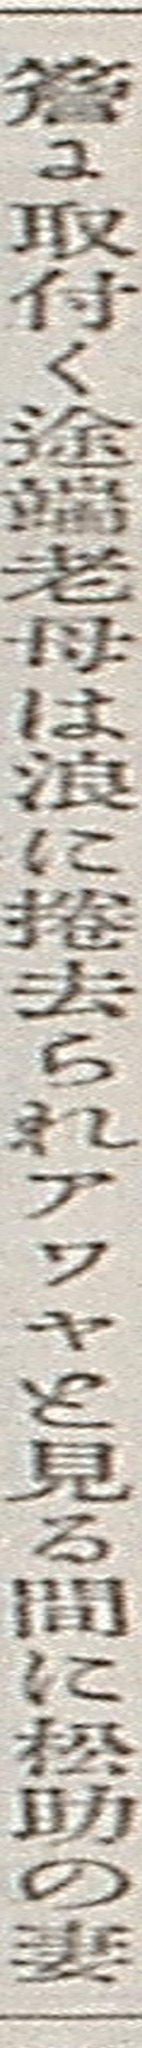簷に取付く途端老母は浪に捲去られアワヤと見る間に松助の妻
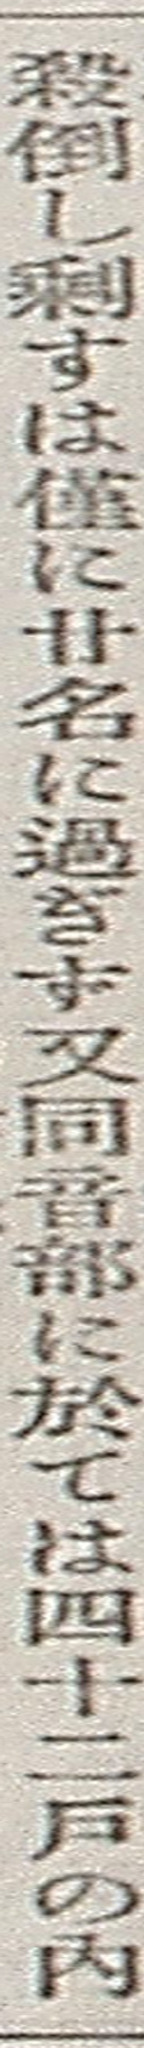殺到し剰すは僅に廿名に過ぎず又同音部に於ては四十二戸の内
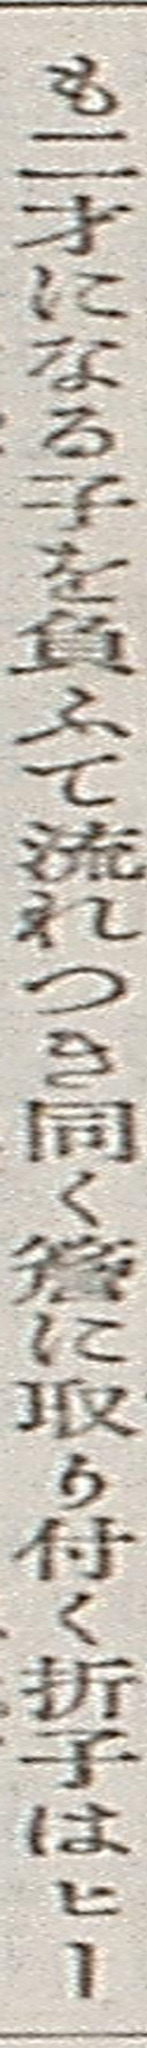も二才になる子を負ふて流れつき同く簷に取り付く折子はヒー
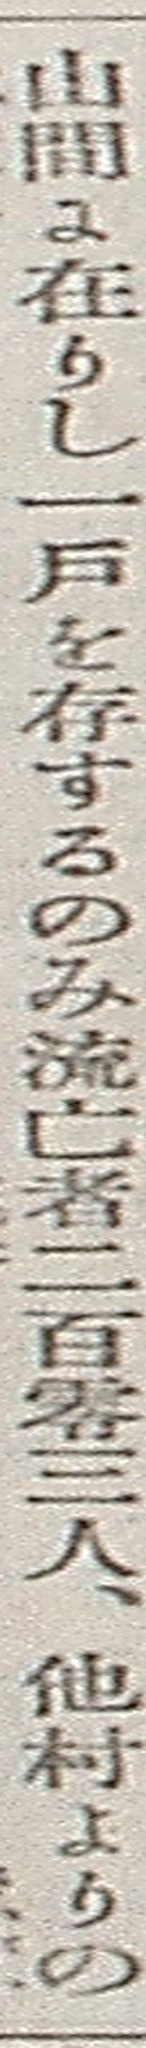山間に在りし一戸を存するのみ流亡者二百零三人、他村よりの
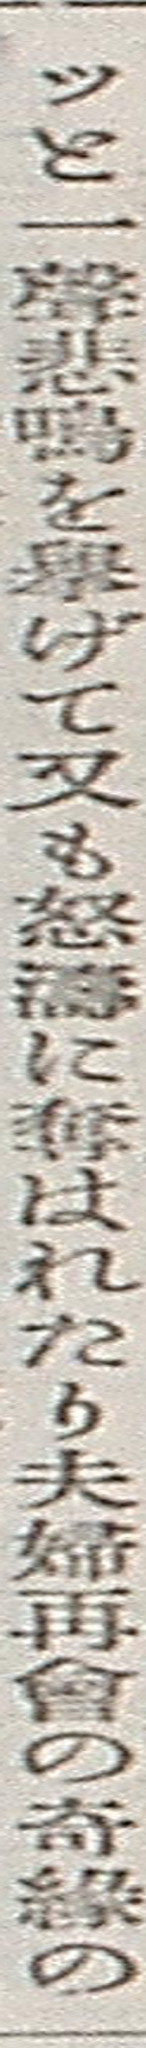ッと一声悲鳴を挙げて又も怒濤に奪はれたり夫婦再会の奇縁の
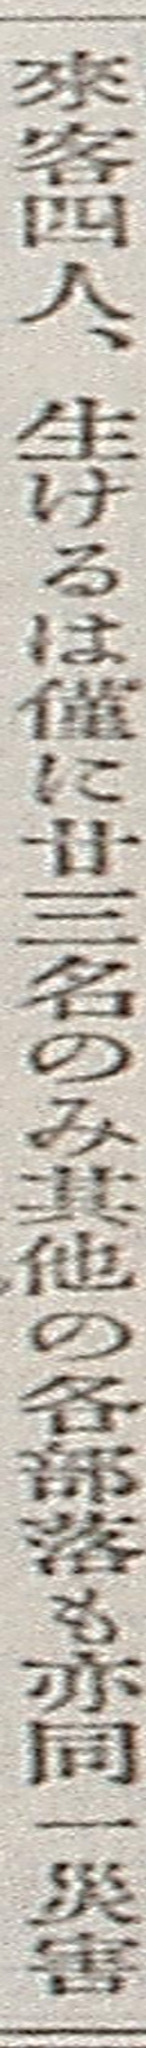来客四人、生けるは僅に廿三名のみ其他の各部落も亦同一災害
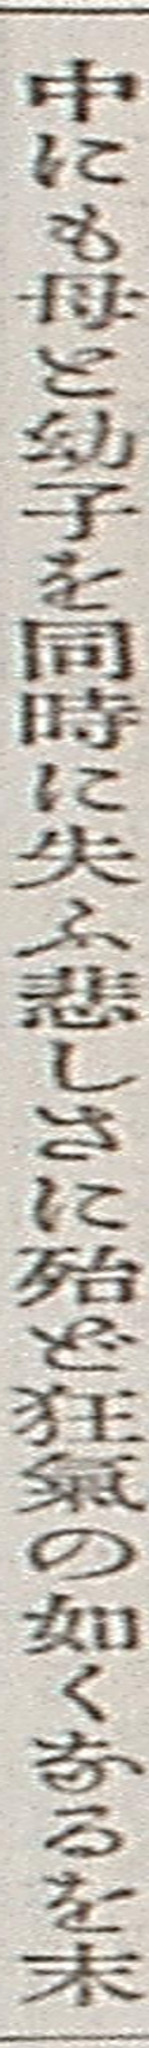中にも母と幼子を同時に失ふ悲しさに殆ど狂気の如くなるを末
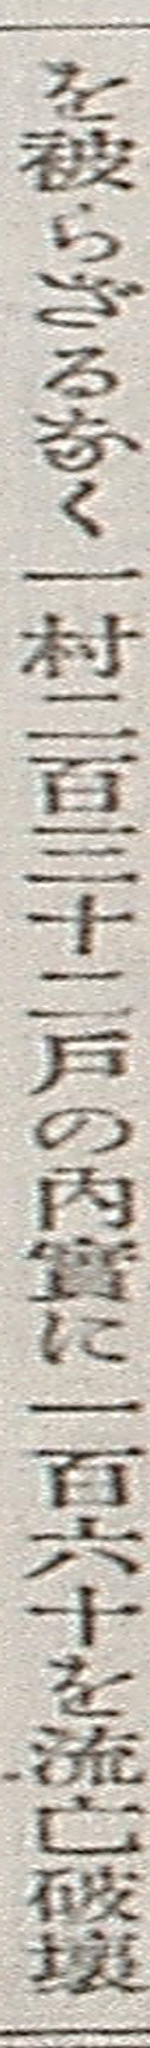を被らざるなく一村ニ百三十二戸の内実に一百六十を流亡破壊

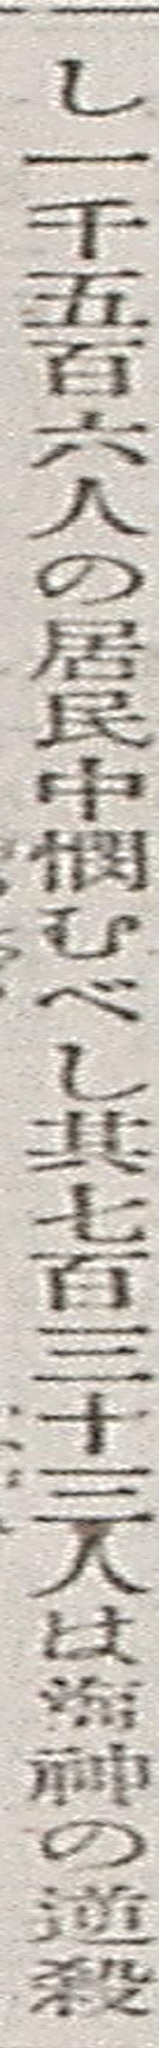し一千五百六人の居民中憫むべし其七百三十三人は海神の逆殺
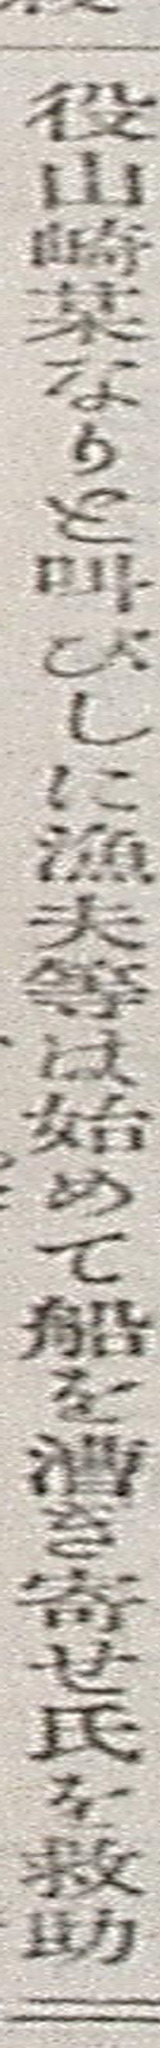役山崎某なりと叫びしに漁夫等は始めて船を漕ぎ寄せ氏を救助
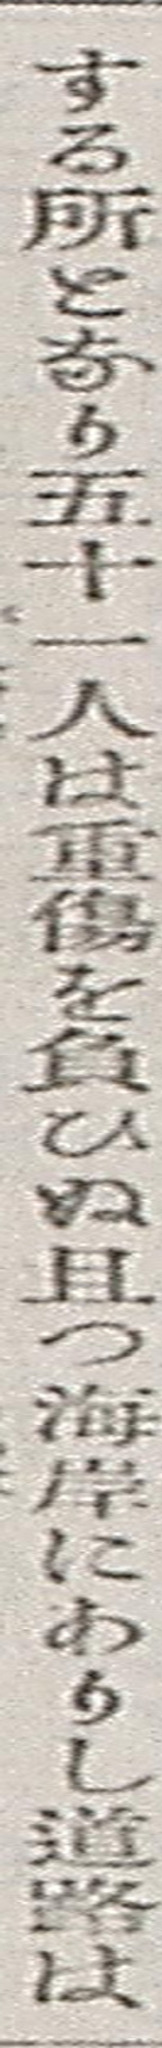する所となり五十一人は重傷を負ひぬ且つ海岸にありし道路は
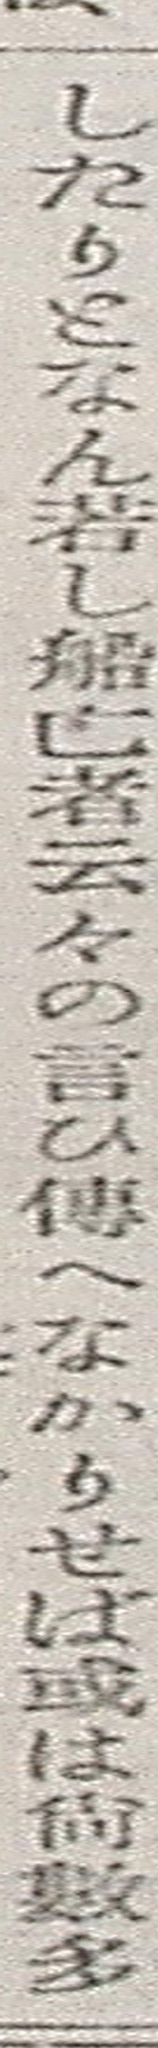したりとなん若し船亡者云々の言ひ伝へなかりせば或は尚数多
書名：風俗畫報臨時増刊第百十九號　大海嘯被害録（中）
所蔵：東京大学地震研究所図書室 Earthquake Research Institute Library, The University of Tokyo, JAPAN
